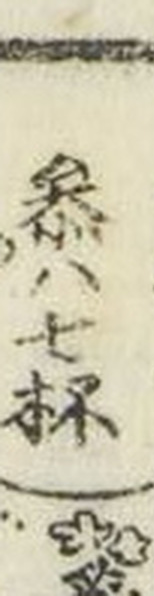参は七杯
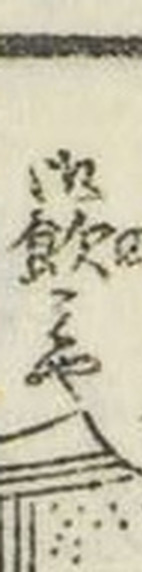御飲みや
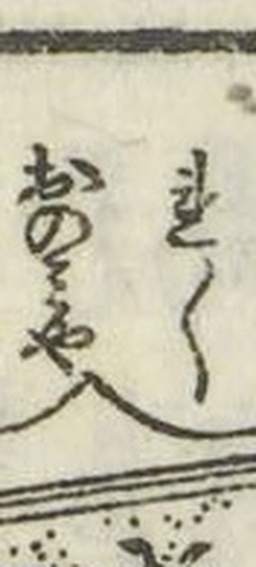おのみや
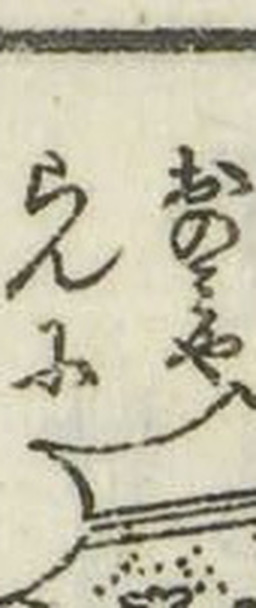らんに
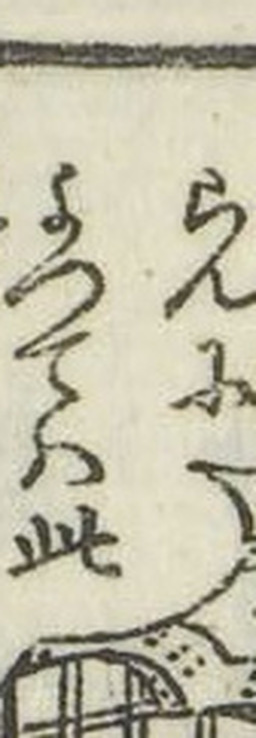よつては此
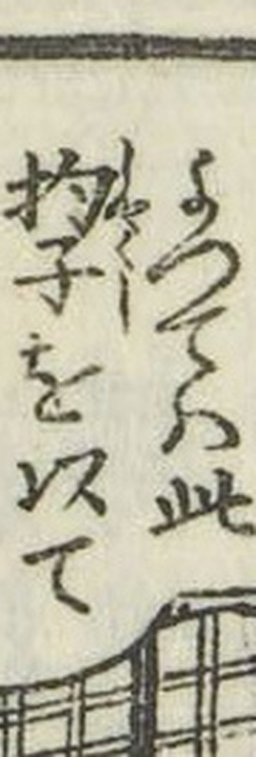杓子を以て
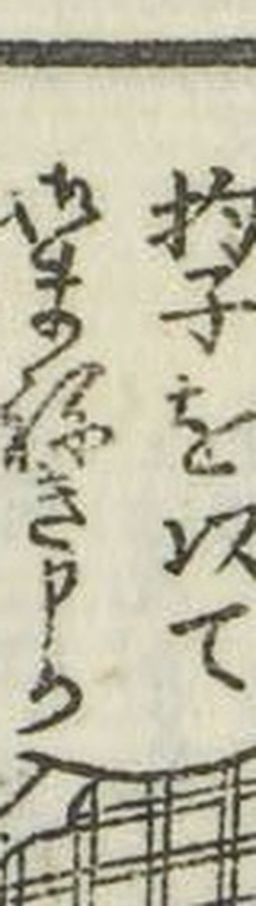御まねき申か
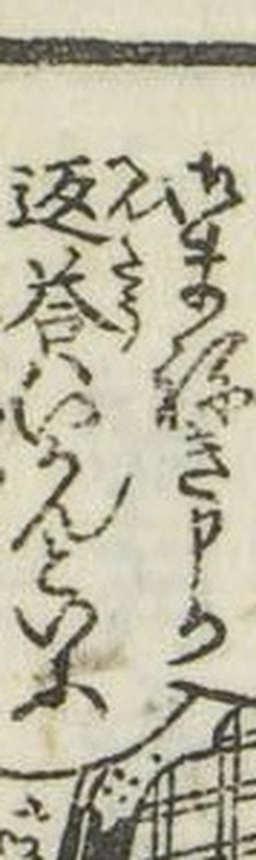返答はいかんといふ
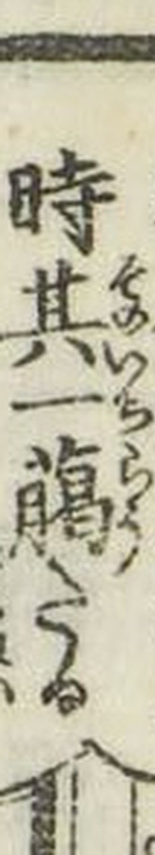時其一﨟たる
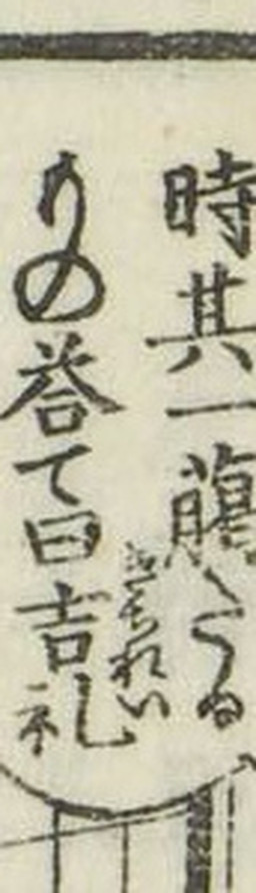もの答て曰吉礼
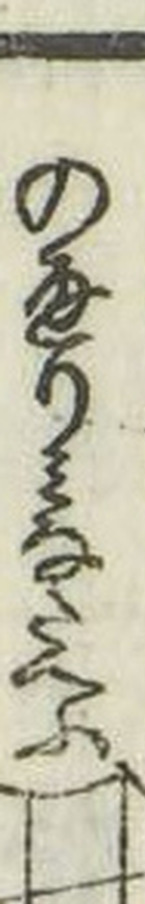の通りみなたへふ
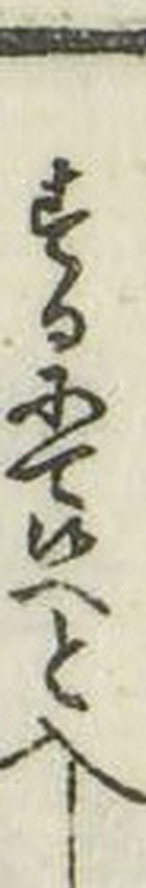するにて候へと
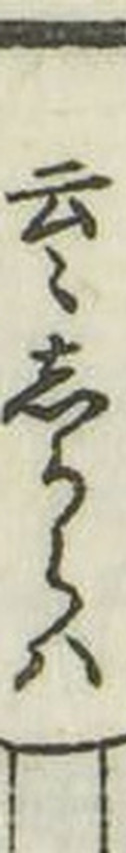云々しからは
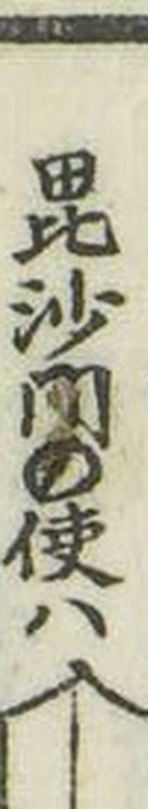毘沙門の使は
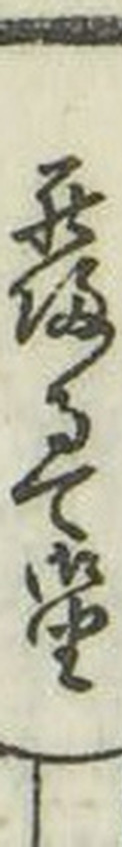罷帰るて御座
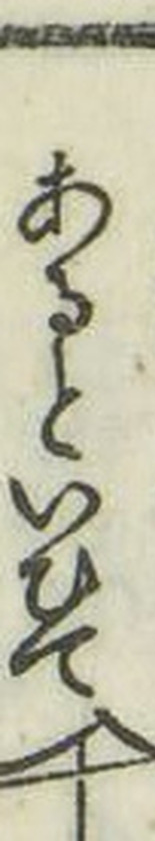あるといひて
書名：江戸名所図会 20巻 巻之3
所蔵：東京学芸大学教育コンテンツアーカイブ
